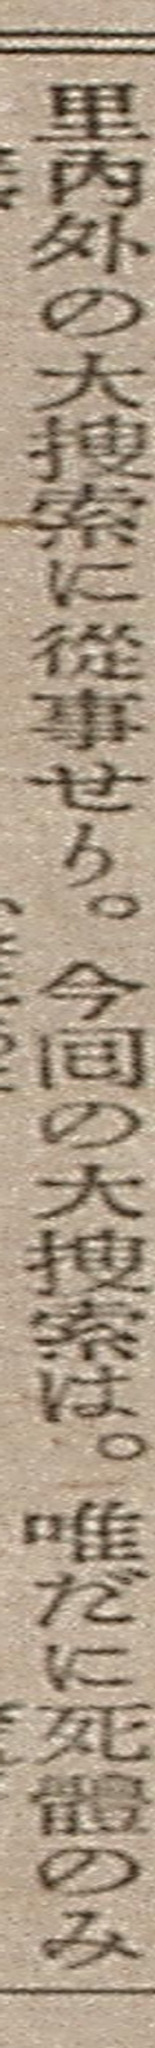里内外の大捜索に従事せり。今回の大捜索は。唯だに死体のみ
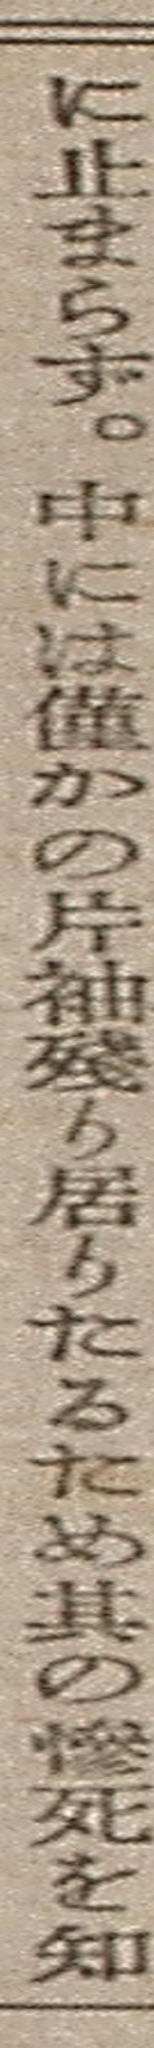に止まらず。中には僅かの片袖残り居りたるため其の惨死を知
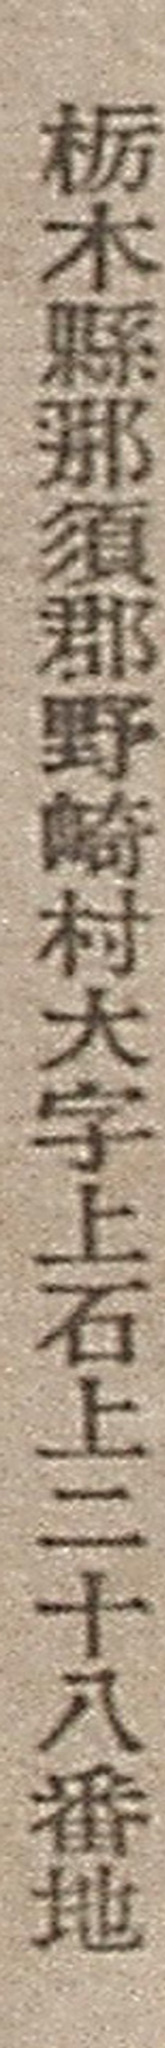栃木県那須郡野崎村大字上石上二十八番地
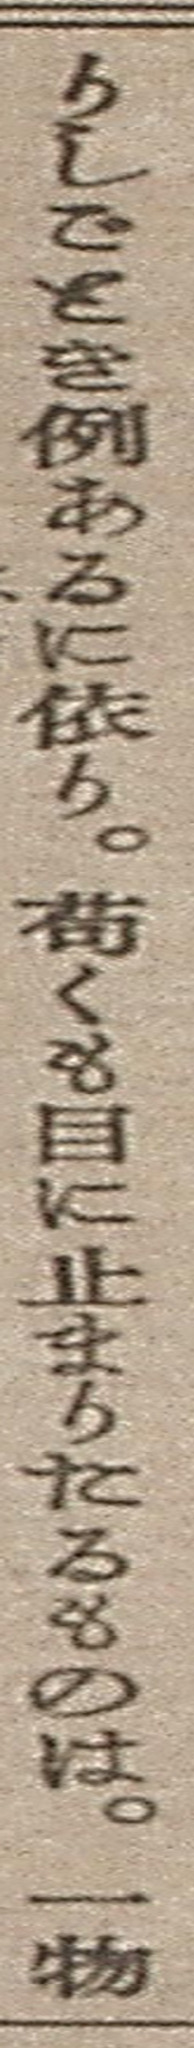りしごとき例あるに依り。苟くも目に止まりたるものは。一物
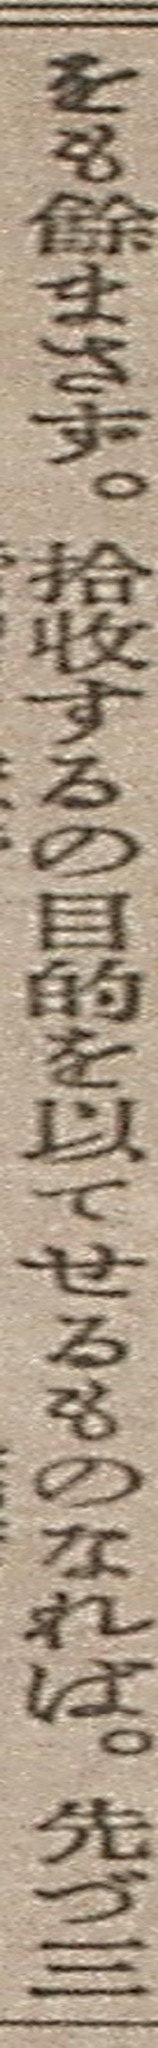をも余まさず。拾収するの目的を以てせるものなれば。先づ三
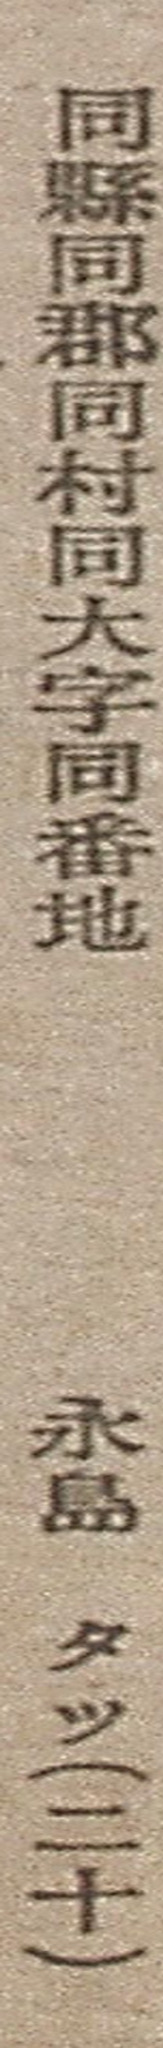同県同郡同村同大字同番地永島タツ
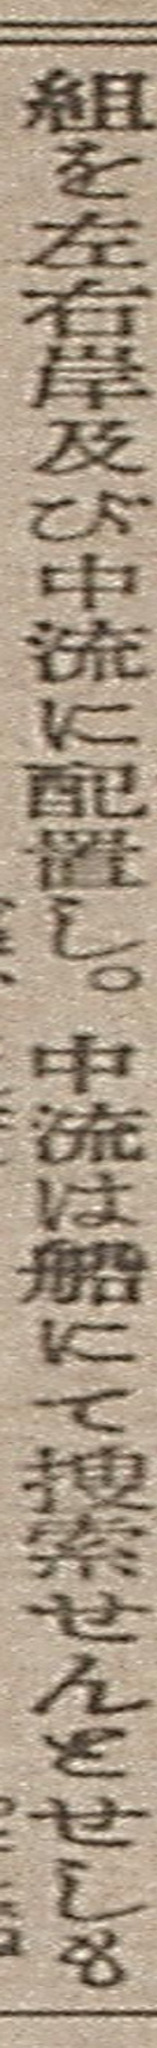組を左右岸及び中流に配置し。中流は船にて捜索せんとせしも
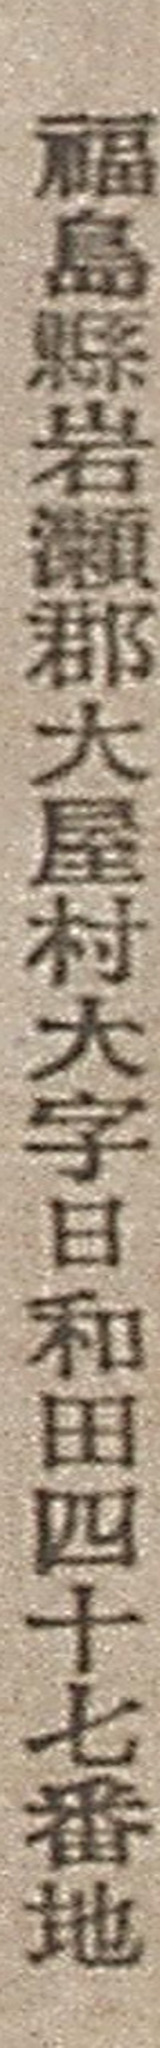福島県岩瀬郡大屋村大字日和田四十七番地
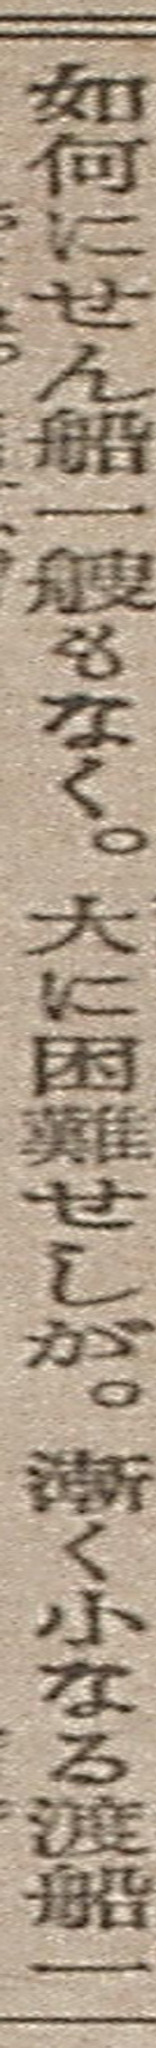如何にせん船一艘もなく。大に困難せしが。漸く小なる渡船一
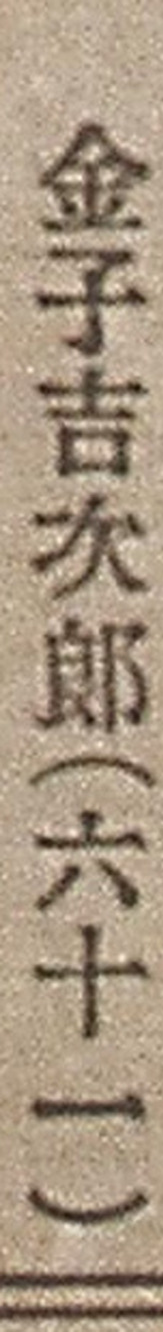金子吉次郎
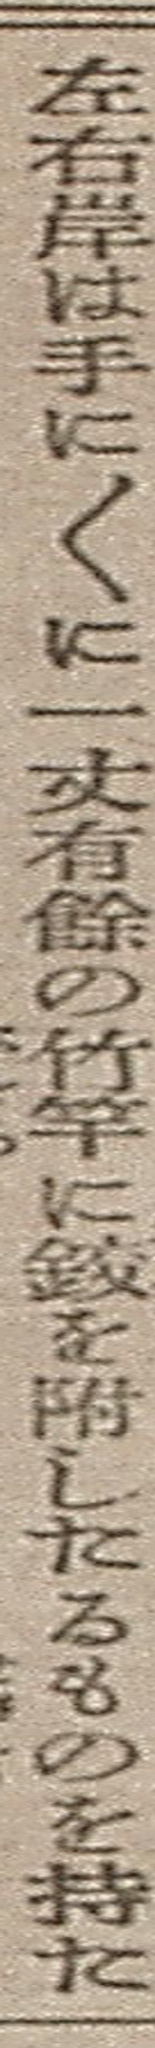左右岸は手に〳〵に一丈有余の竹竿に鉸を付したるものを持た
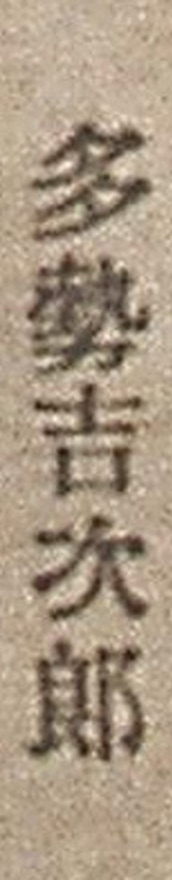金子吉次郎
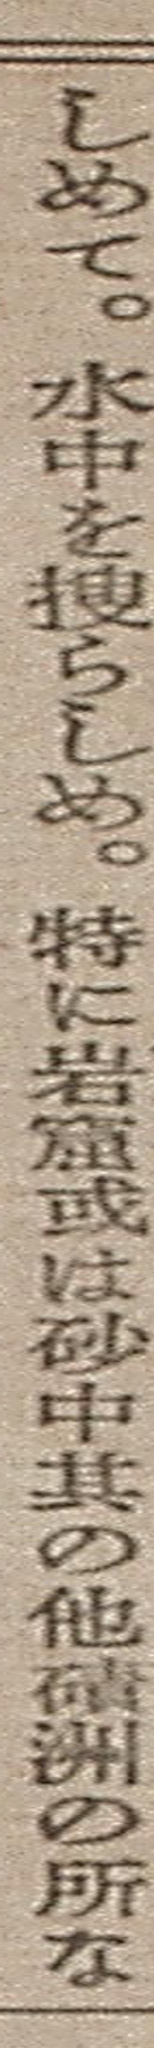しめて。水中を捜らしめ。特に岩窟或は砂中其の他磧洲の所な
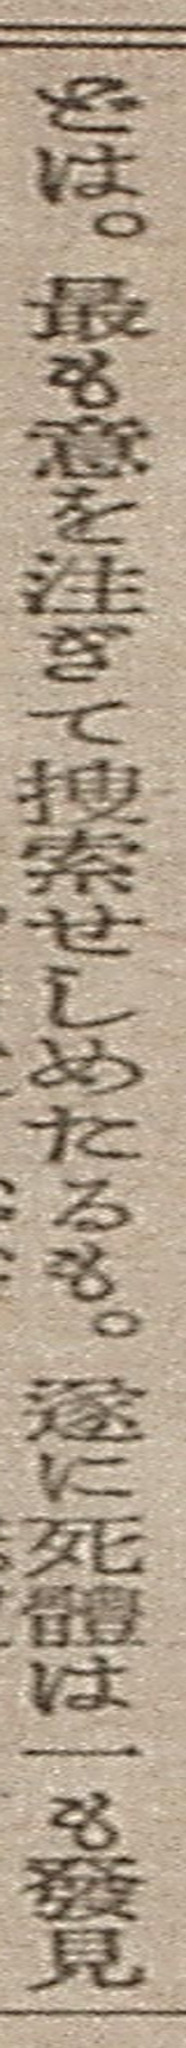どは。最も意を注ぎて捜索せしめたるも。遂に死体は一も発見
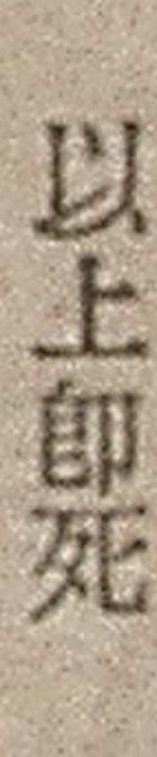以上即死
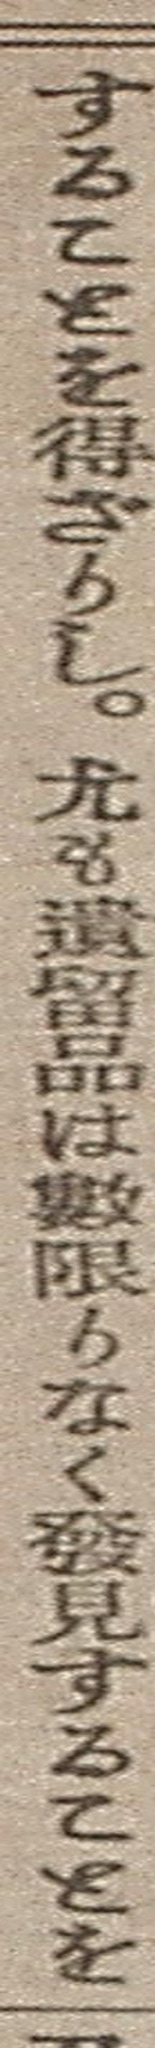することを得ざりし。尤も遺留品は数限りなく発見することを
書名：風俗畫報臨時増刊第百九十九號　明治三十二年十月各地災害圖會（前編之續）
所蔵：東京大学地震研究所図書室 Earthquake Research Institute Library, The University of Tokyo, JAPAN
